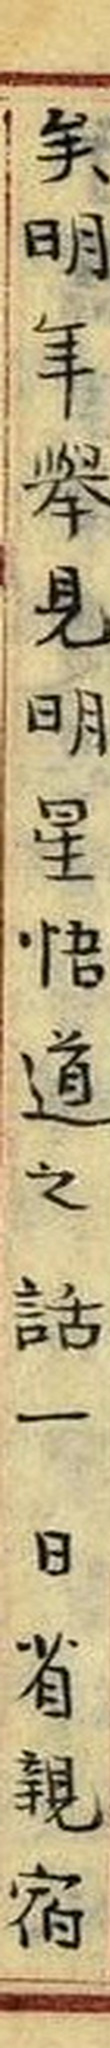矣明年擧見明星悟道之話一日省親宿

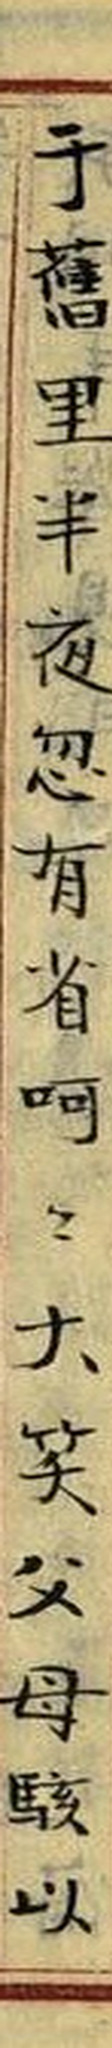于𦾔里半夜忽有省呵々大笑父母駭以
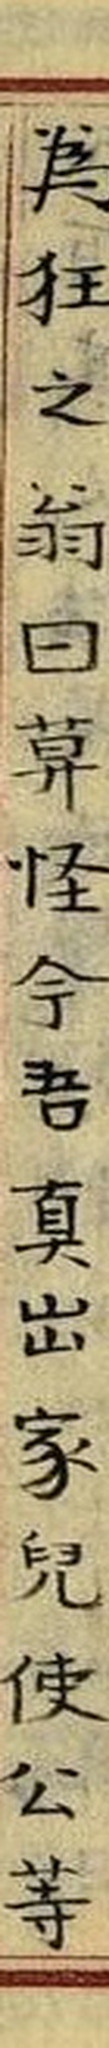為狂之翁曰莫怪今吾真出家兒使公䓁
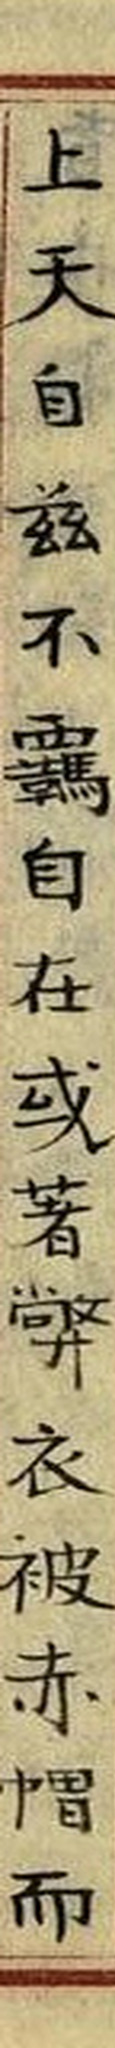上天自玆不覊自在或著㢢衣被赤帽而
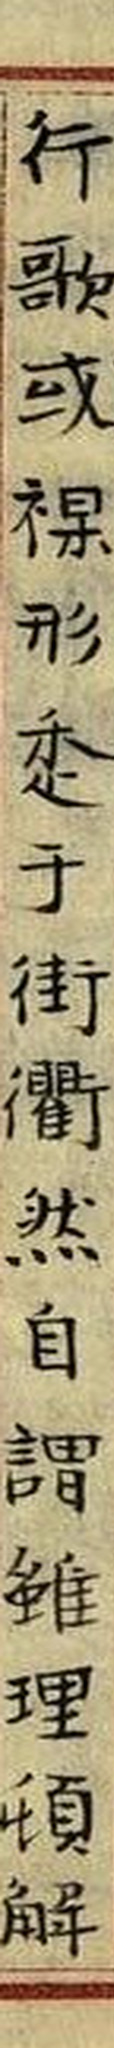行歌或裸形于街衢然自謂雖理頓解
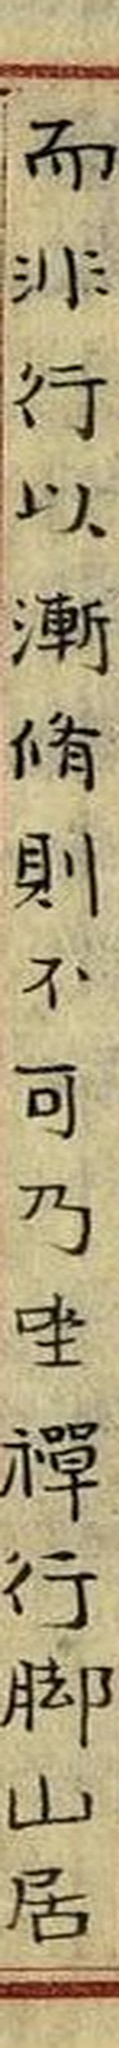而非行以漸脩則不可乃㘴禪行脚山居
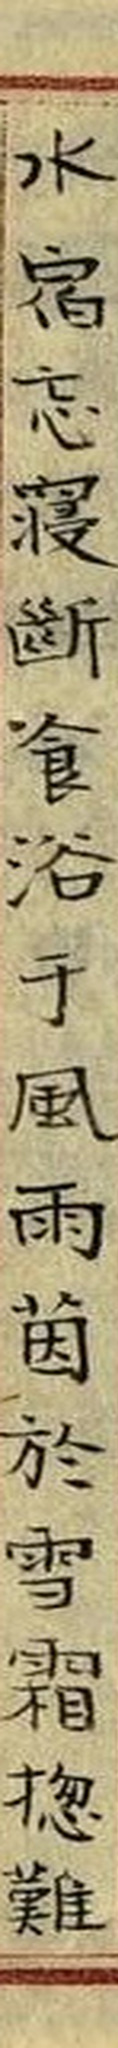水宿忘寝斷食浴于風雨茵於雪霜揔難
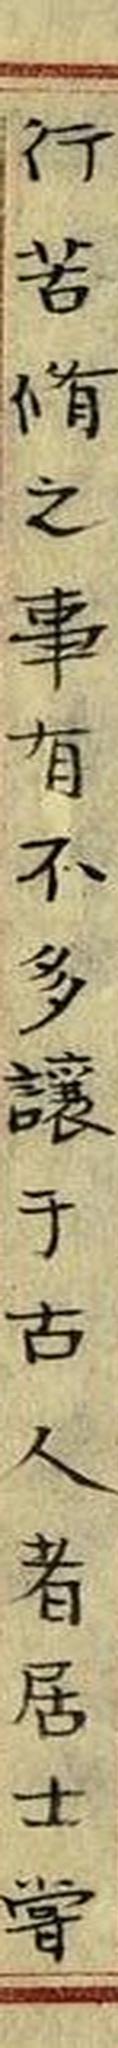行苦脩之事有不多譲于古人者居士甞
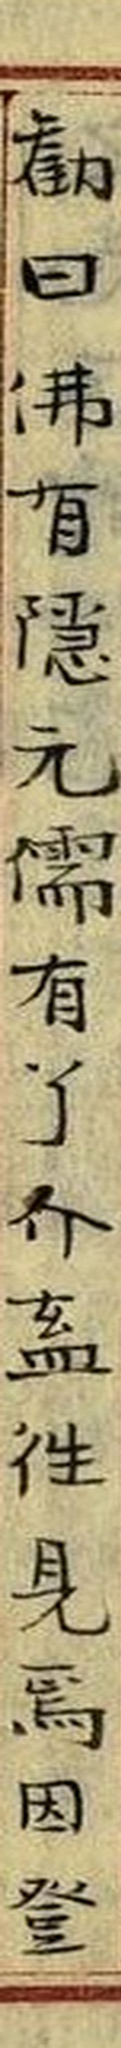勧曰佛有隠元儒有了介盍往見焉因登
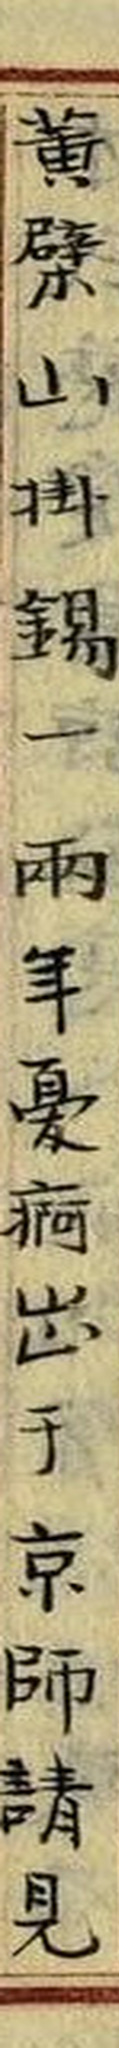黄檗山掛錫一兩年憂痾出于京師請見
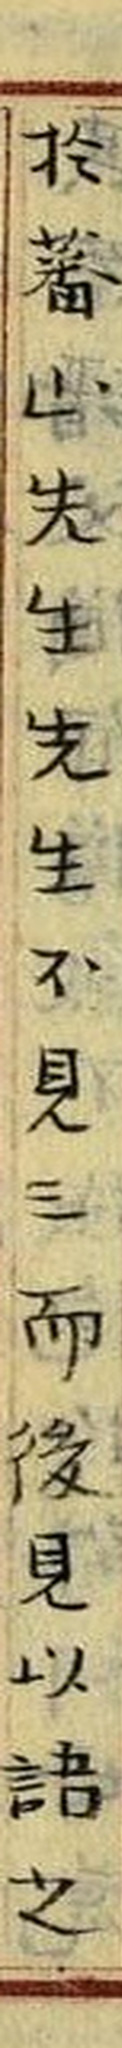於蕃山先生先生不見三而後見以語之
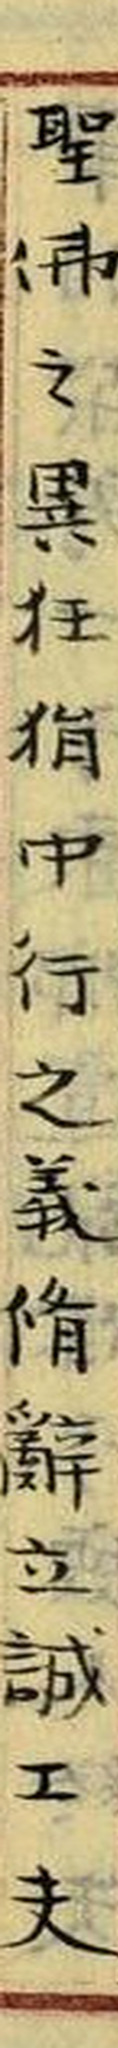聖佛之異狂狷中行之義脩辭立誠工夫
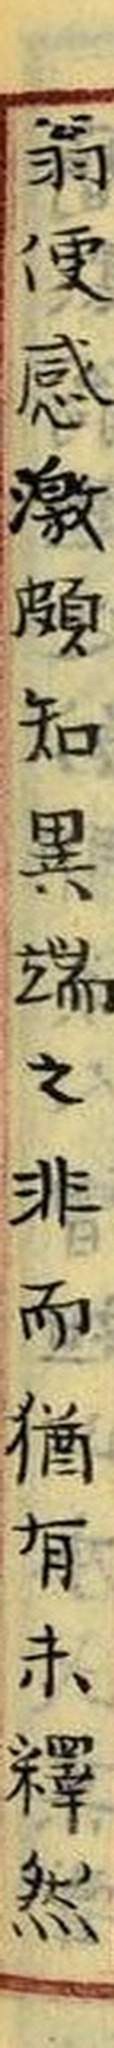翁便感激頗知異端之非而猶有未釋然
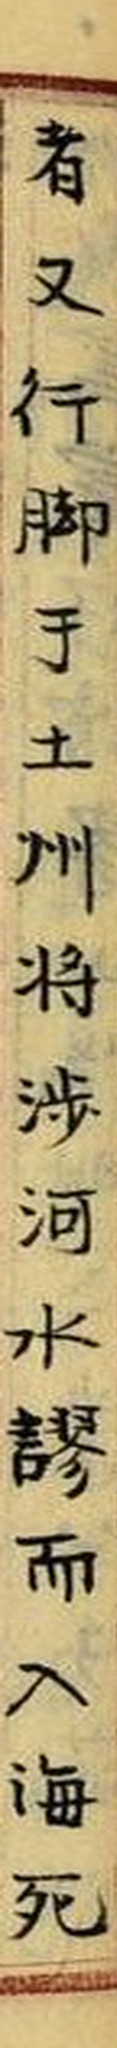者又行脚于土州将渉河水謬而入海死
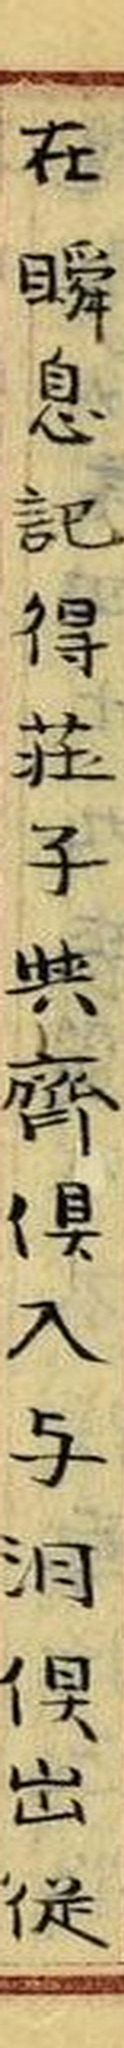在瞬息記得荘子與齊倶入与泪倶出従
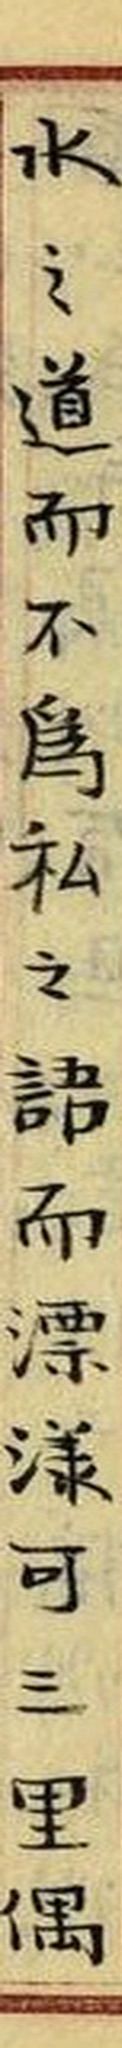水之道而不爲私之語而漂𣻌可三里偶
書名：温古集 四巻
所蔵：福井県文書館 Fukui Prefectural Archives
